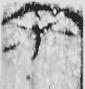宋
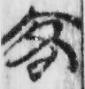客
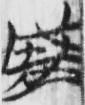盛
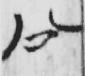公
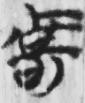甹（聘）
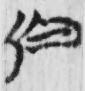於
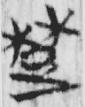楚
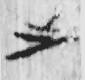之
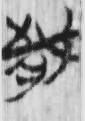歲（歲）
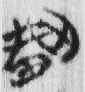荊（荆）
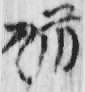𫵖
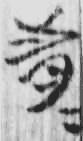之月
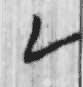乙
